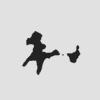利
